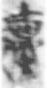○（秦）
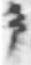弓
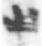用
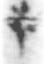矢
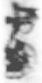○（箙）
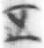五
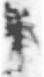秉
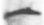一
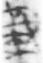載
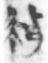紫
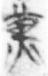黃
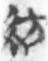紡
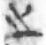之
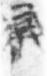綳
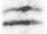二
